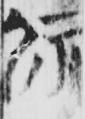𫵖
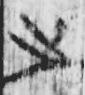之
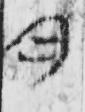月
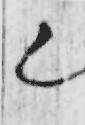乙
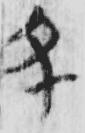丑
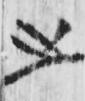之
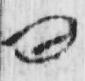日
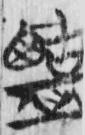○（盬）
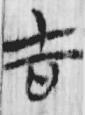吉
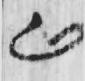㠯（以）
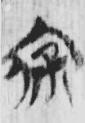保
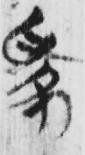○（家）
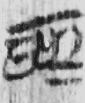爲
